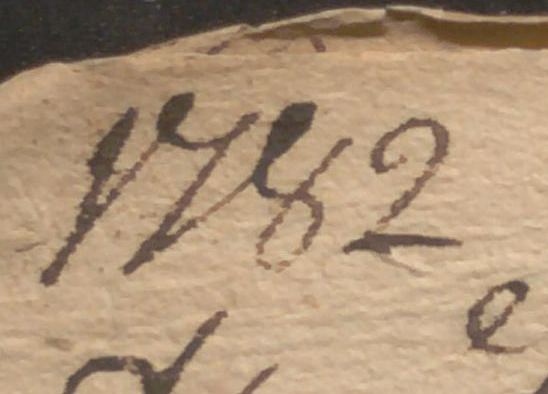1782
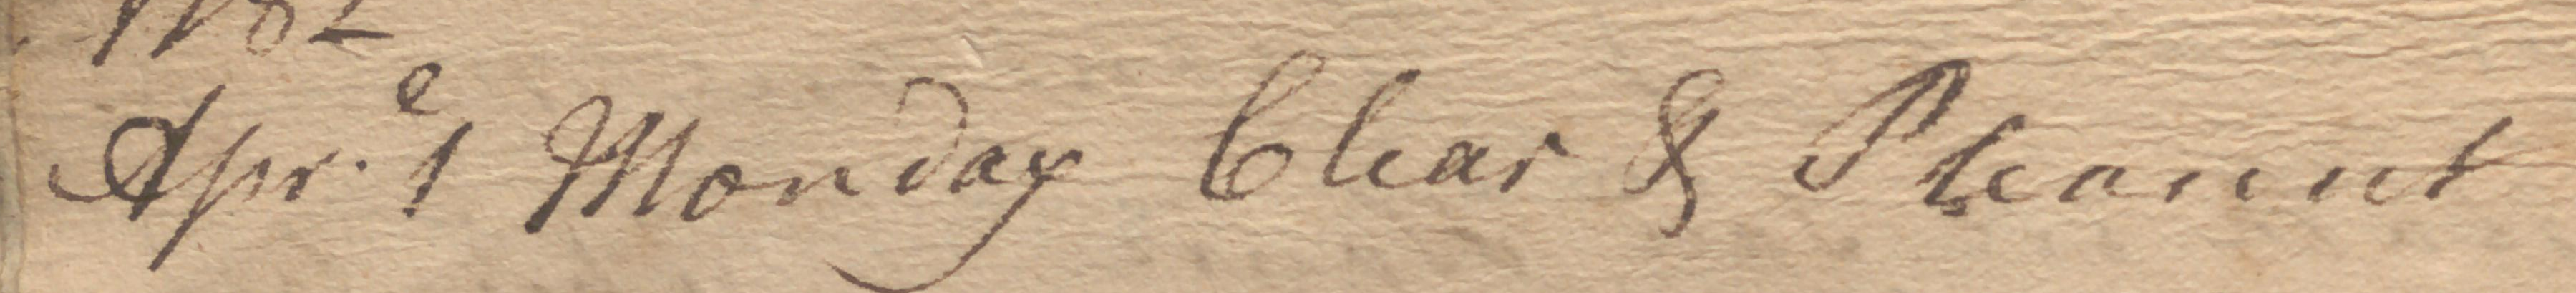Apr^l. 1 Monday Clear & Pleasent
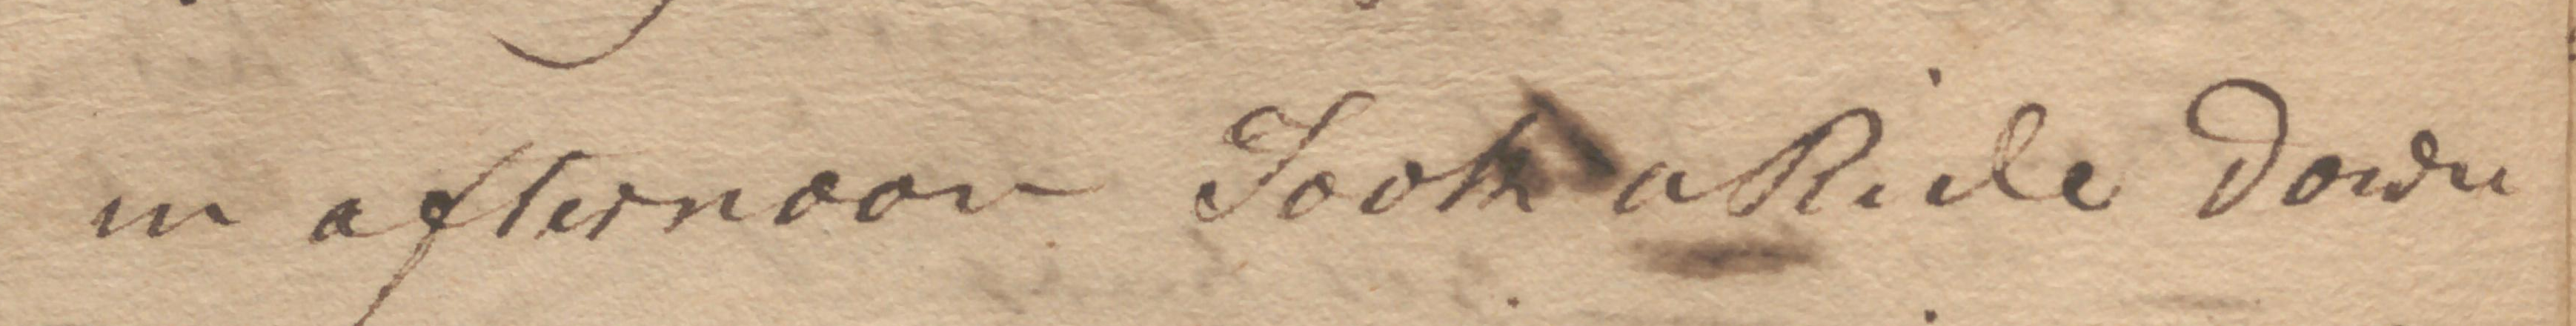in afternoon Took a Rice down
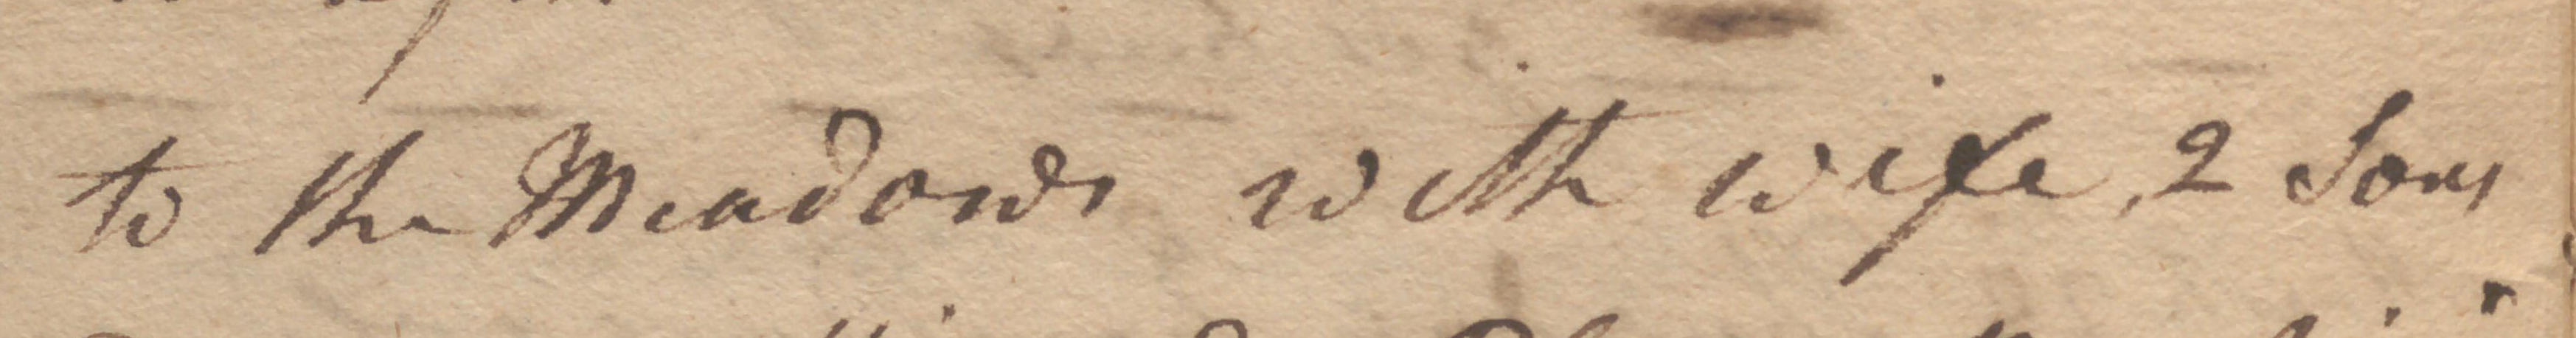to the Meadows with wife, 2 Sons
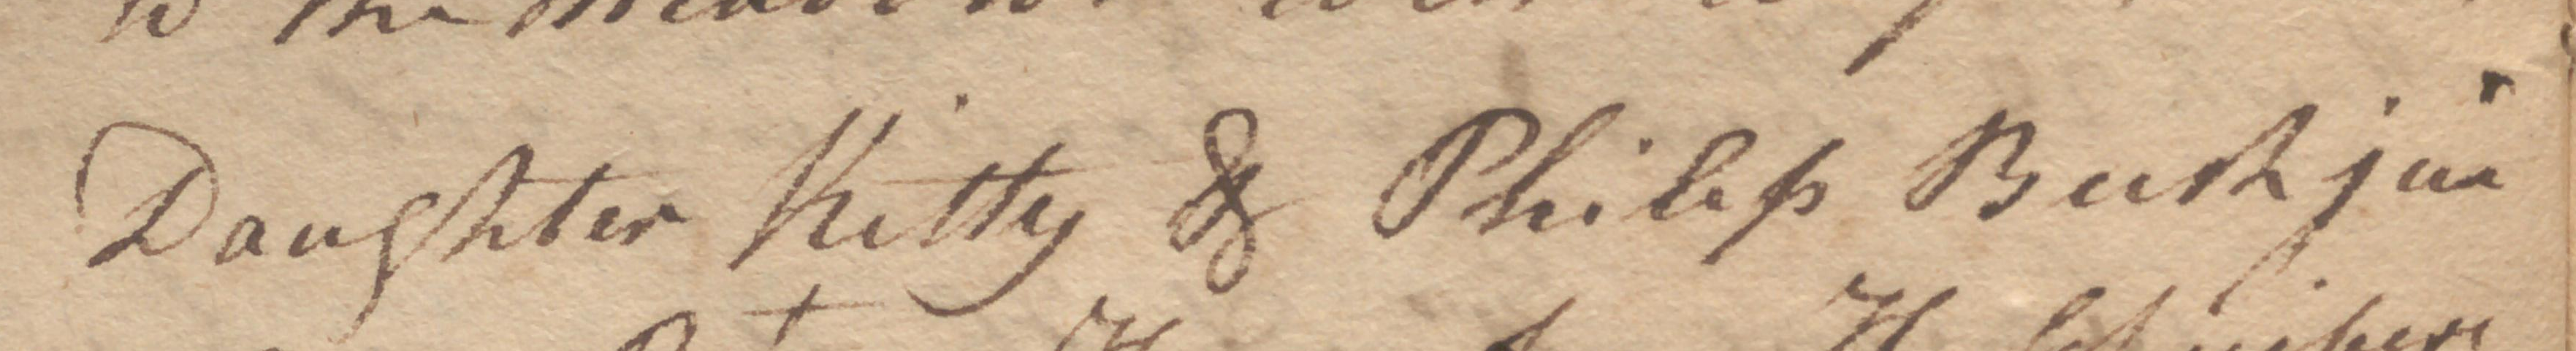Daughter Kitty & Philip Bush jun^r
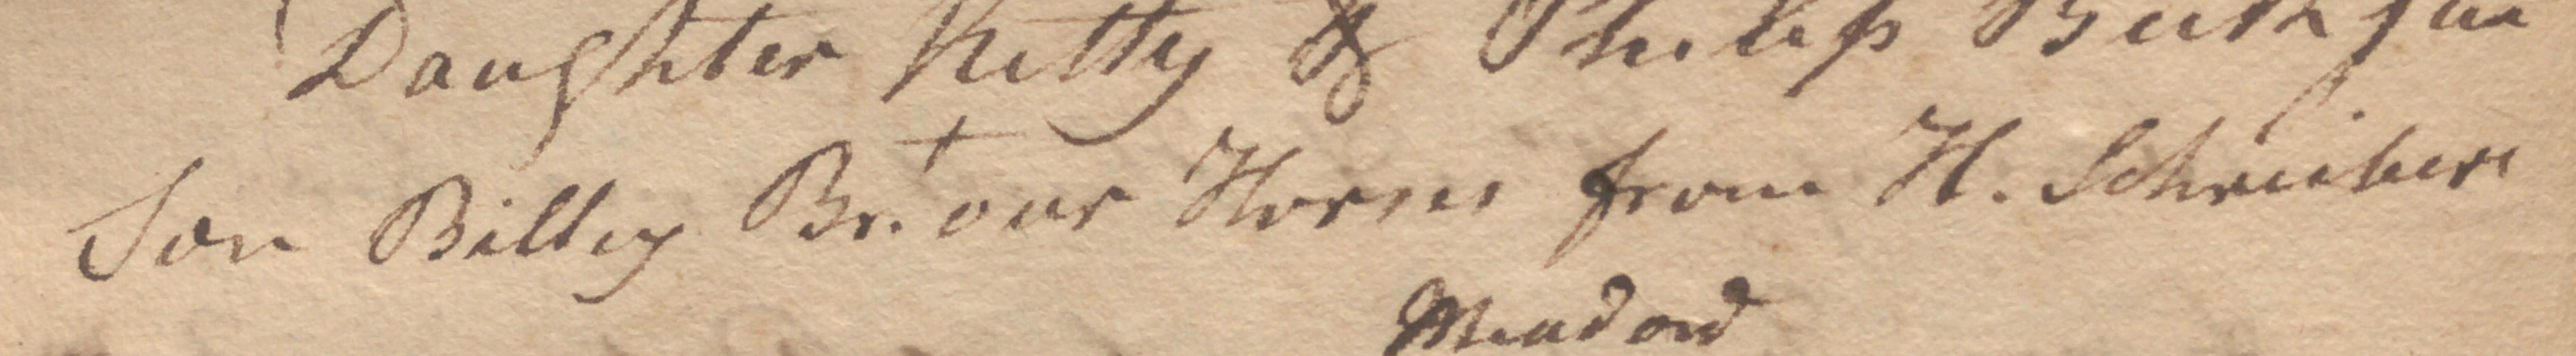Son Billey Br^t. our Horses from H. Schreibers
